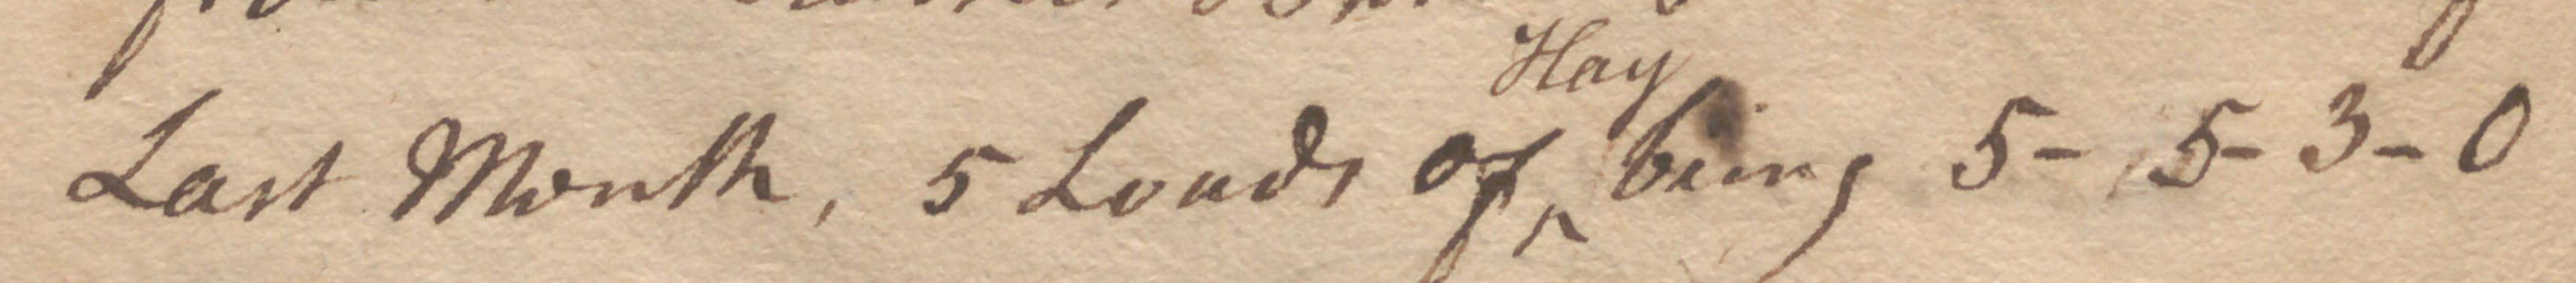Last Month, 5 Loads of ^ being 5-5-3-0
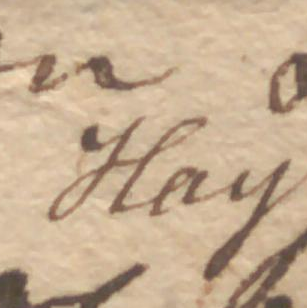Hay
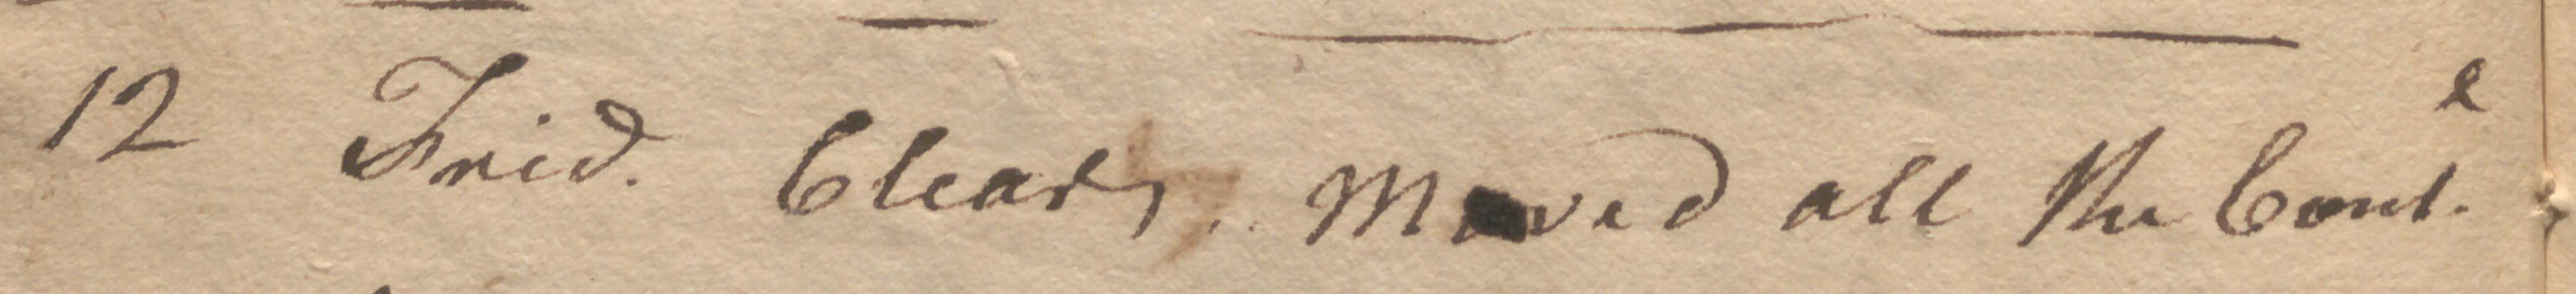12 Frid. Clear, Moved all the Cont^l.
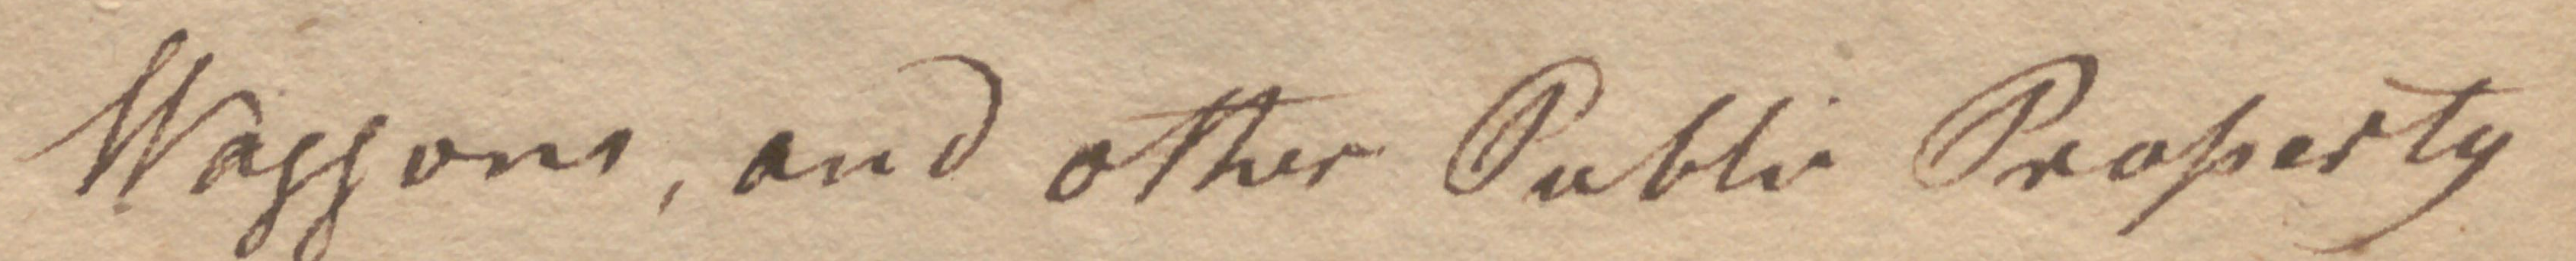Waggons, and other Public Property
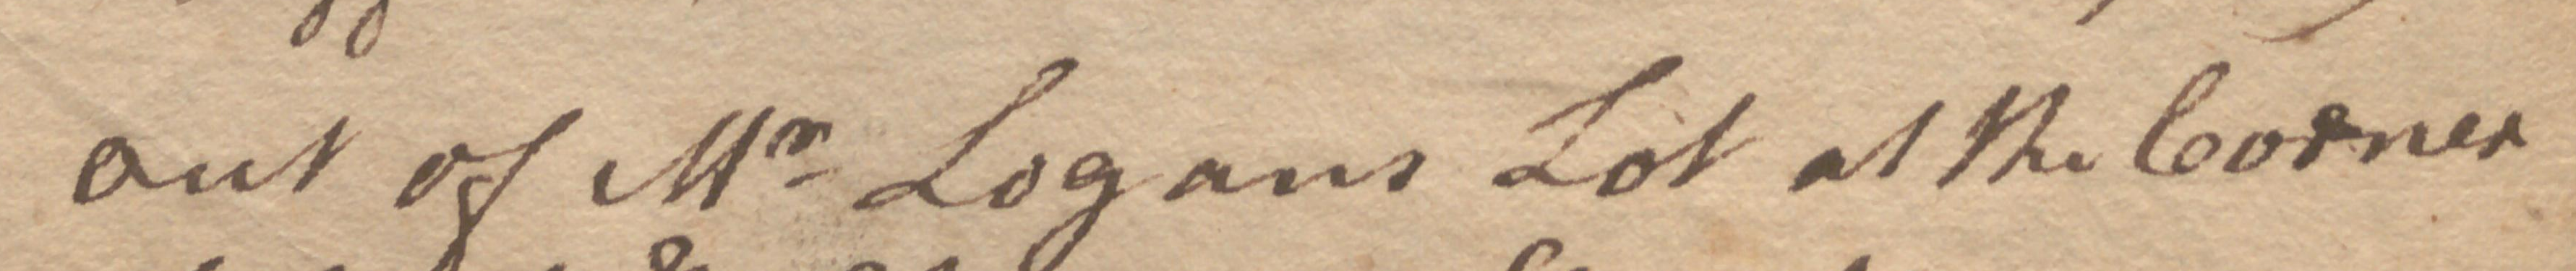out of M^r. Logans Lot at the Corner
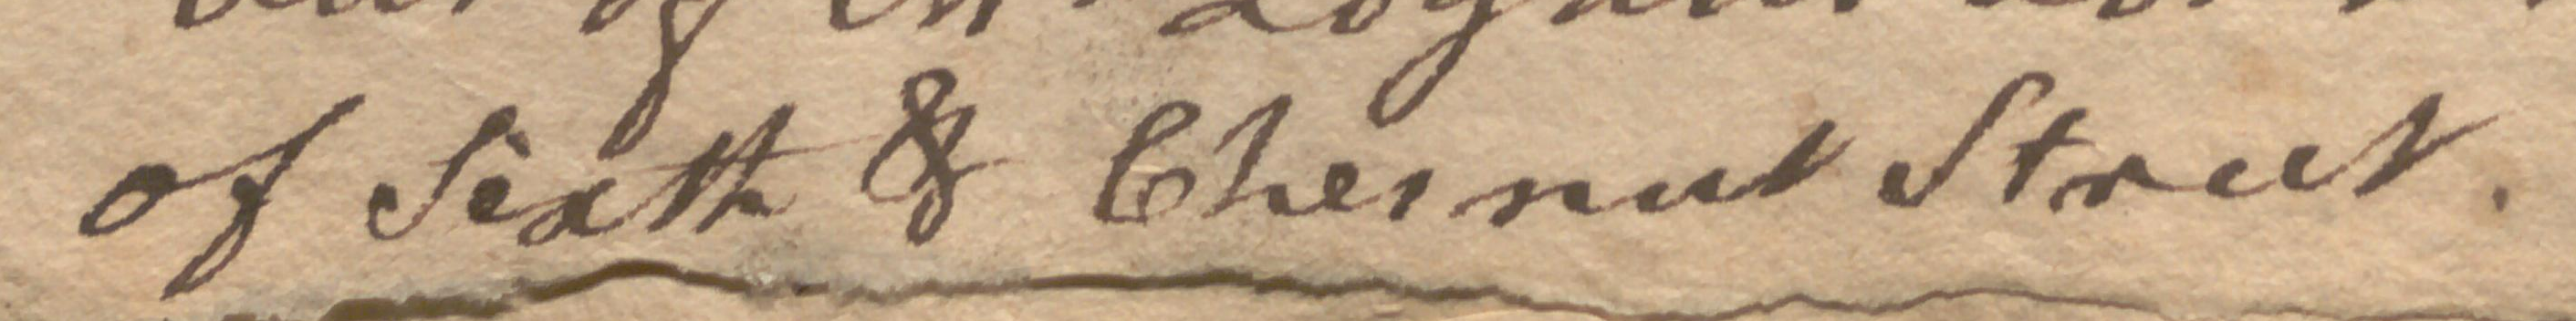of Sixth & Chesnut Street
